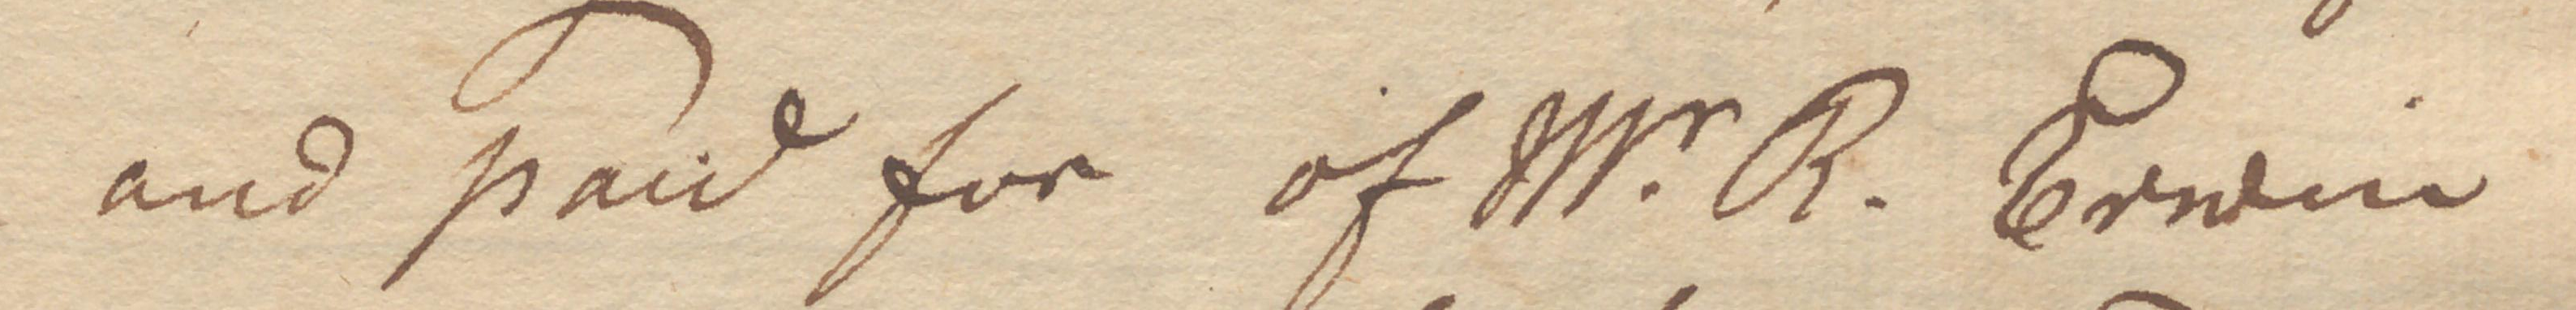and paid for of M^r. R. Erwin
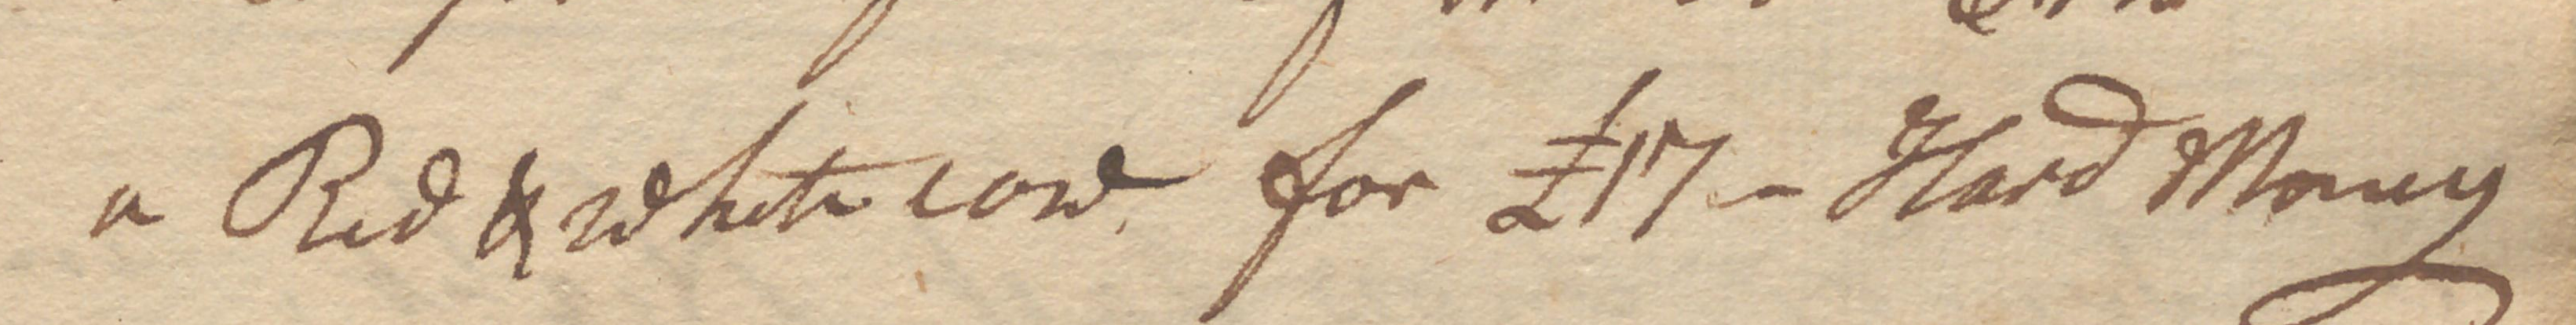a Red & whitecow. for £17- Hard Money
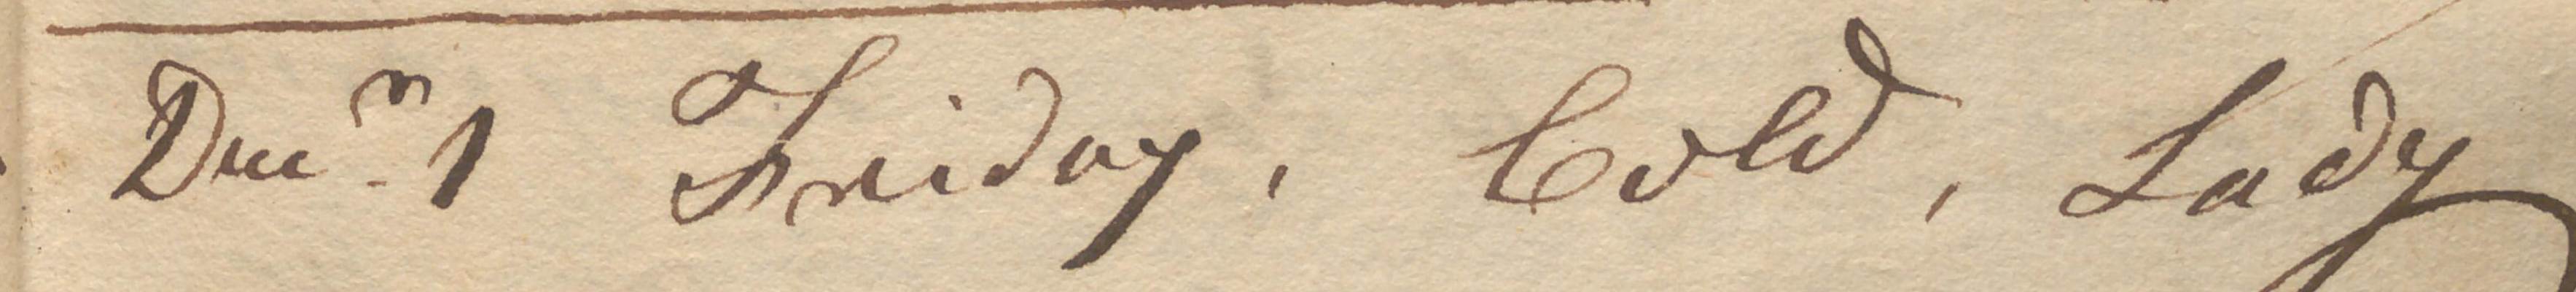Decc^r. 1 Friday. Cold, Lady
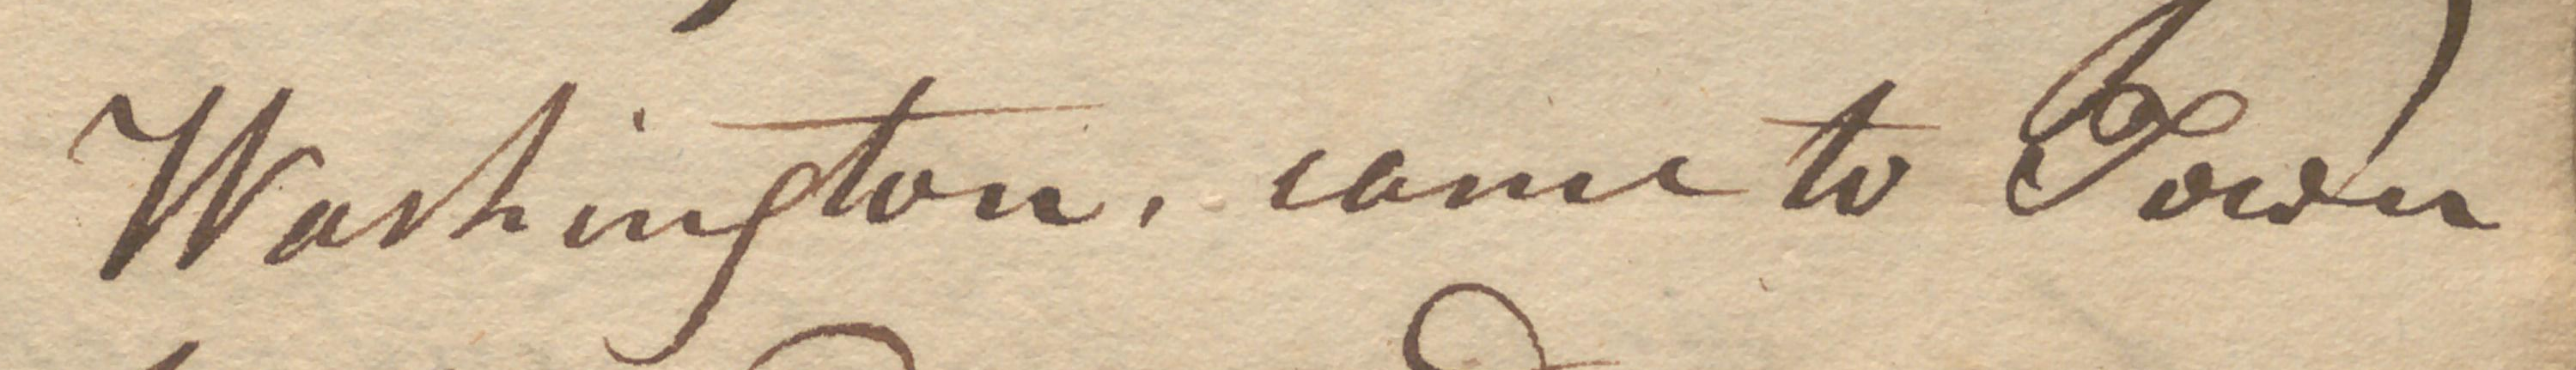Washington, came to Town
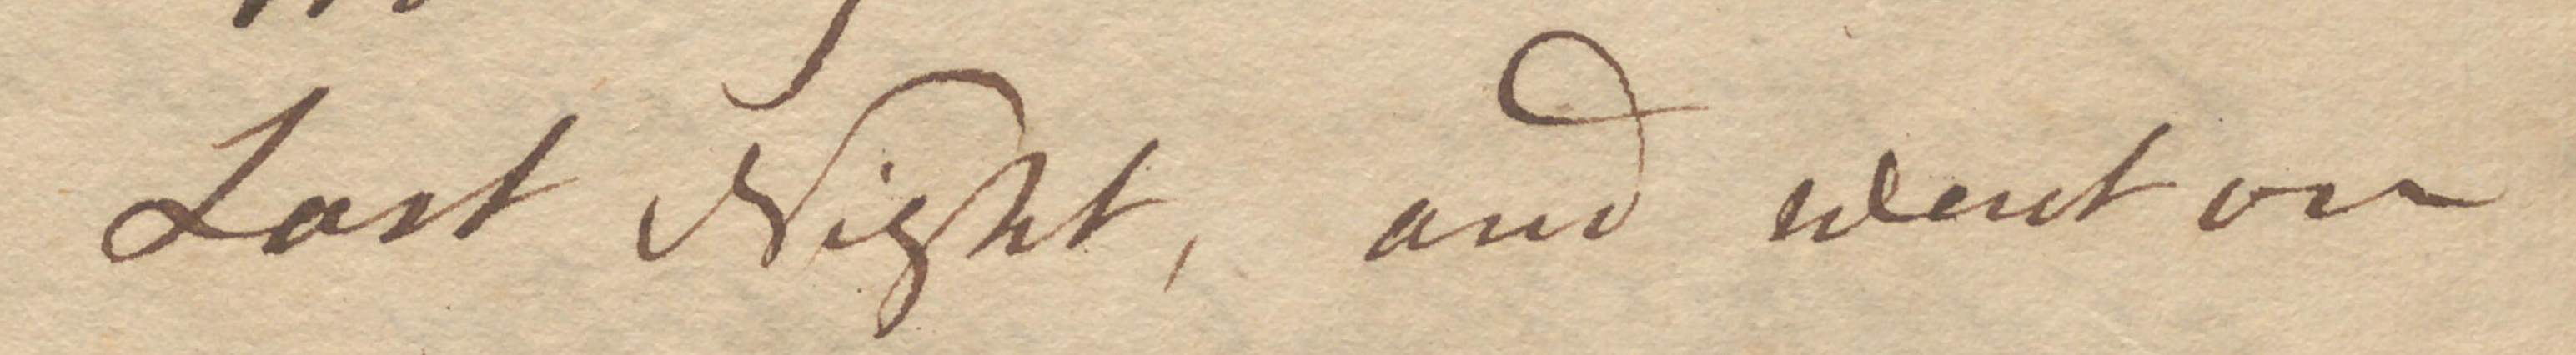Last Night, and went on
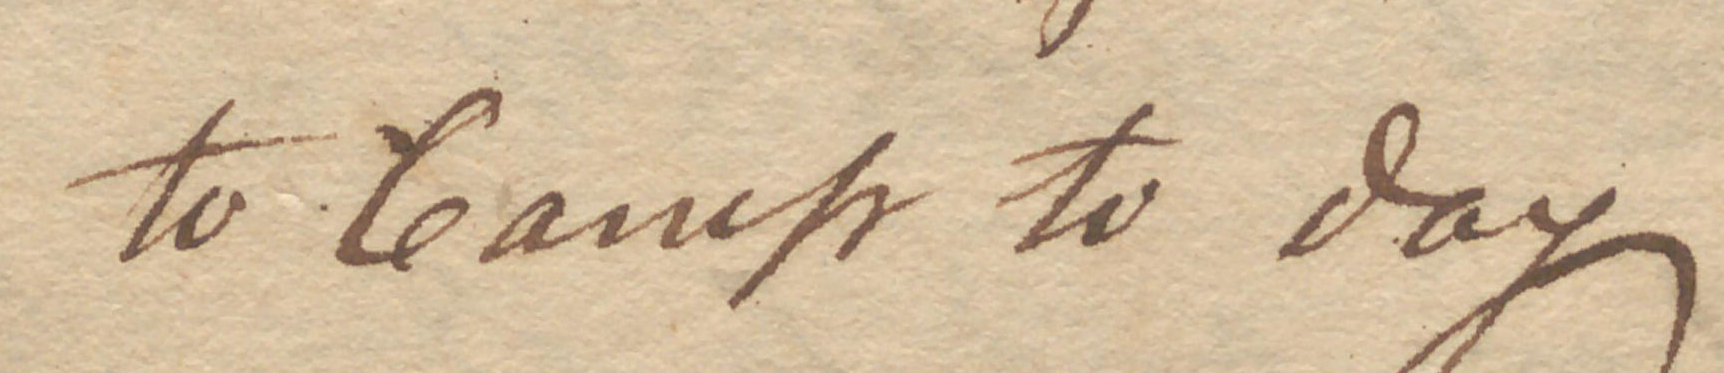to Camp to day
